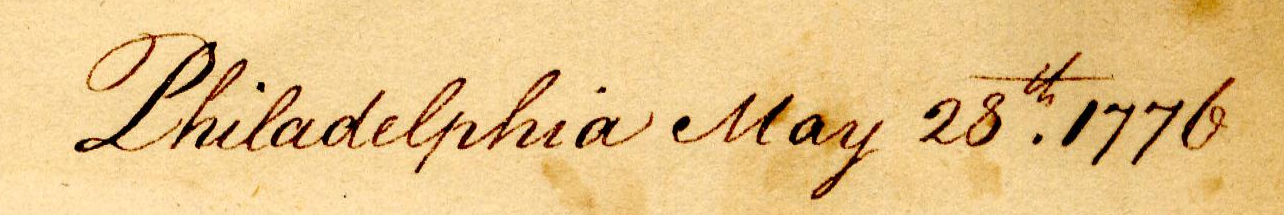Philadelphia May 28^th. 1776
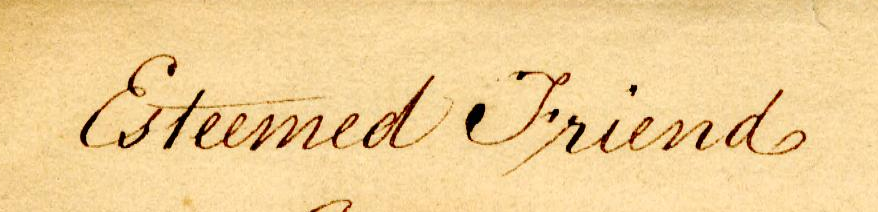Esteemed Friend
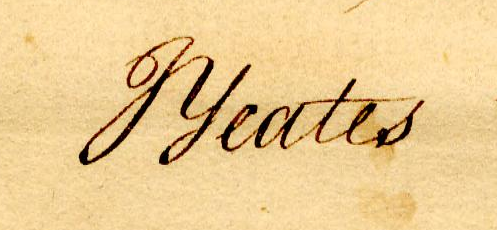J Yeates
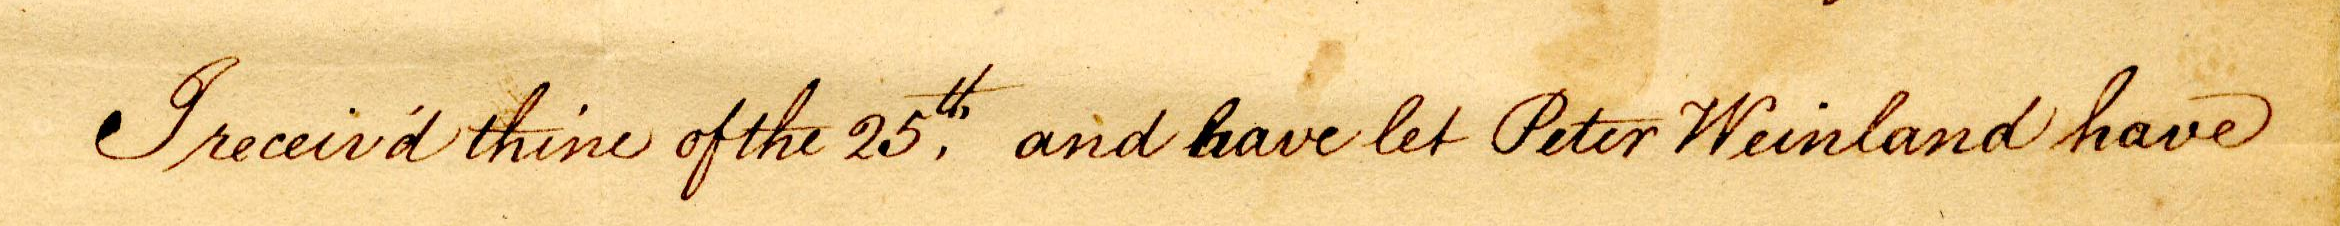I receiv'd thine of the 25^th, and have let Peter Weinland have
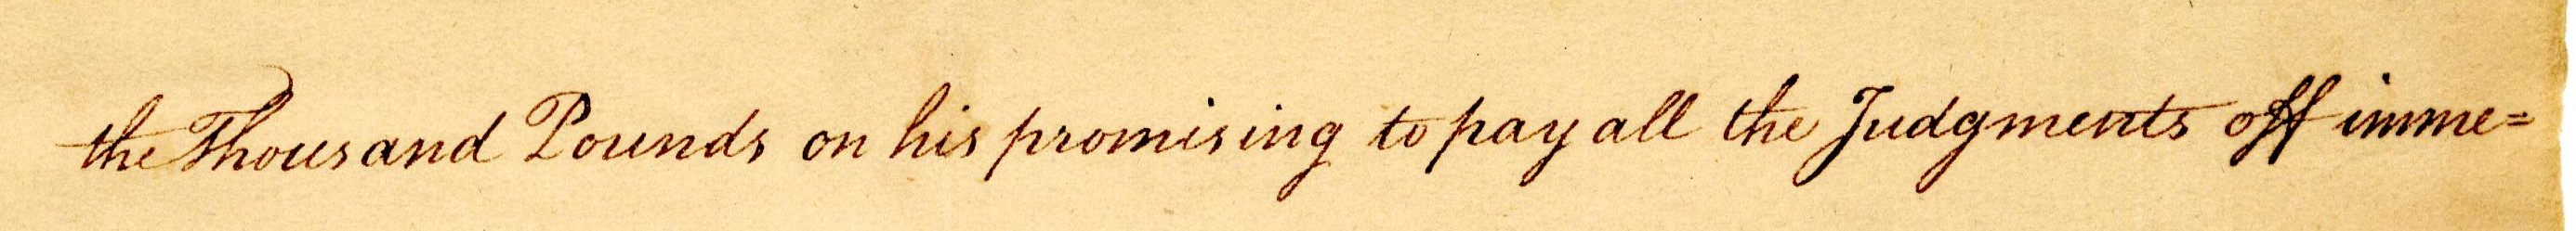the thousand Pounds on his promising to pay all the Judgments off imme-
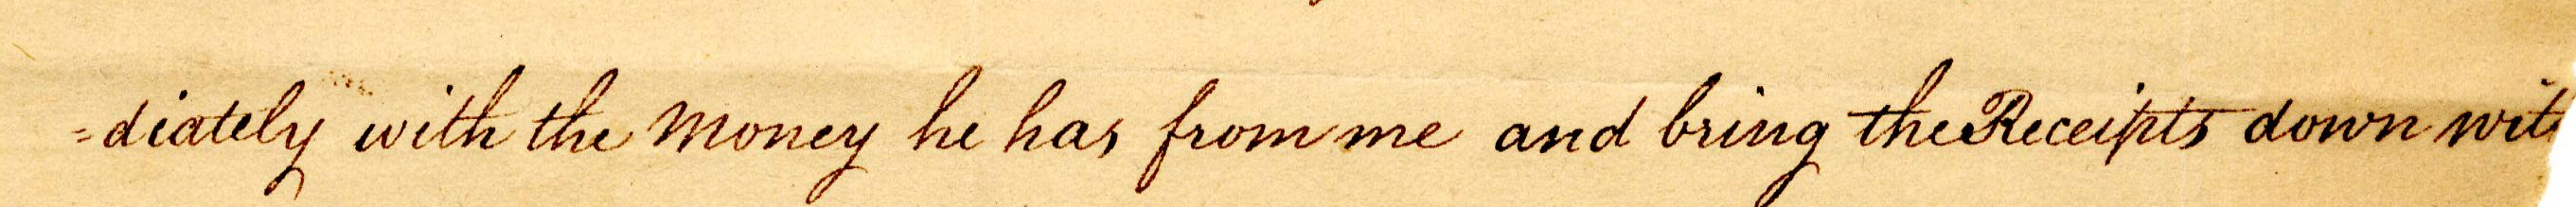-diately with the money he has from me and bring the Receipts down wit
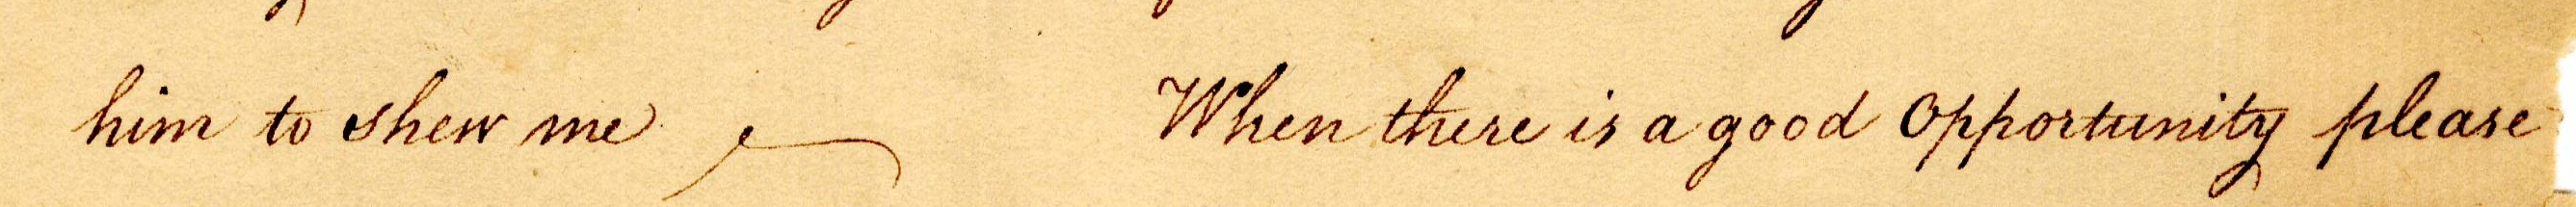him to shew me- When there is a good opportunity please
